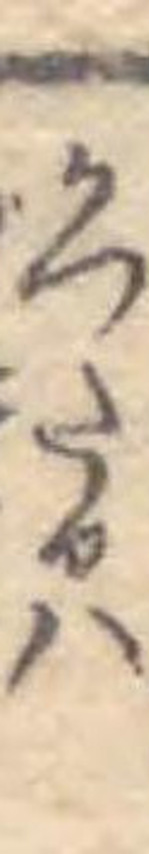かつたるは
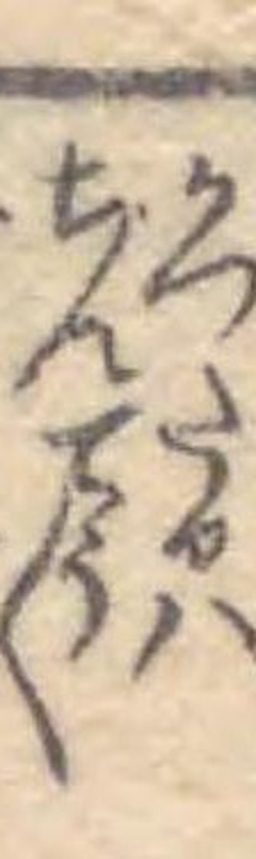ちんてう
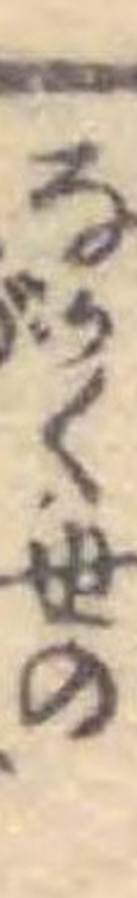なかく世の
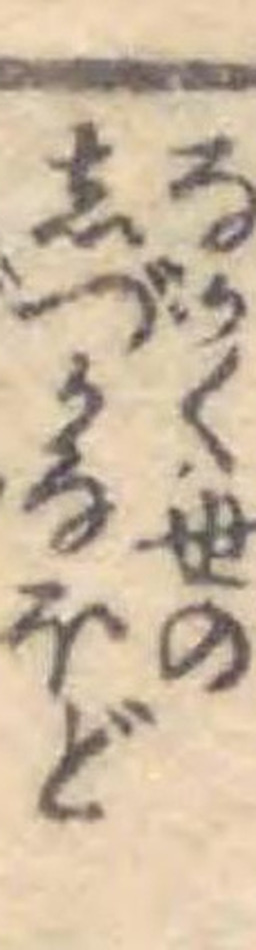しづかなるほど
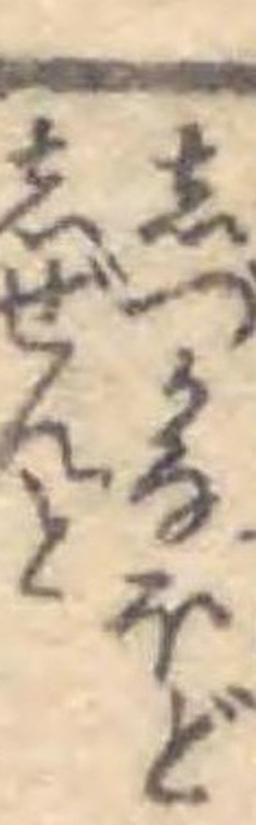しぜんと
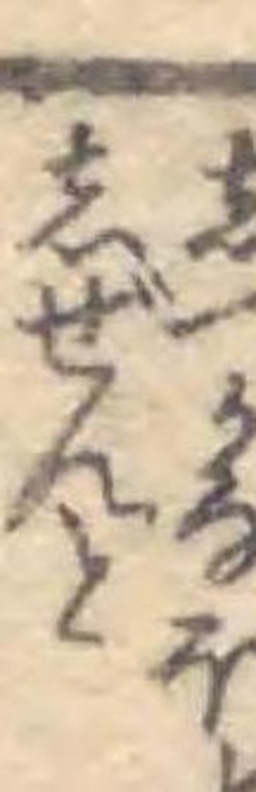しぜんと
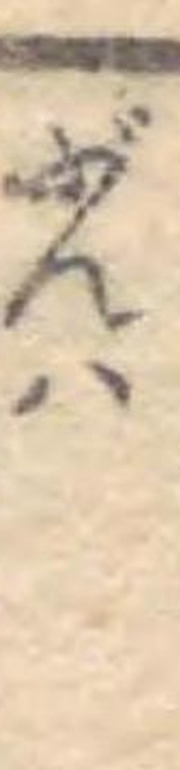ぶんは
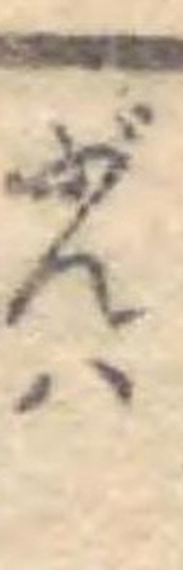ぶんは
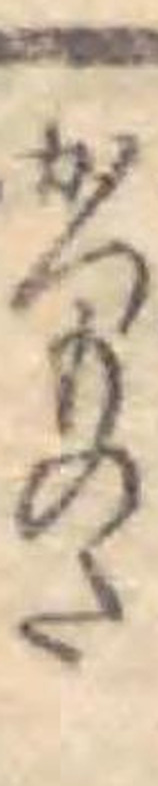かつものだ
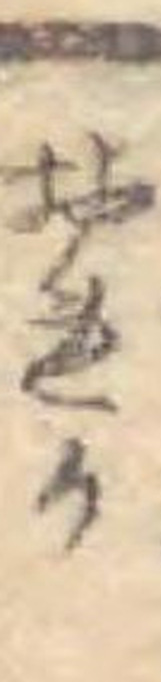おれか
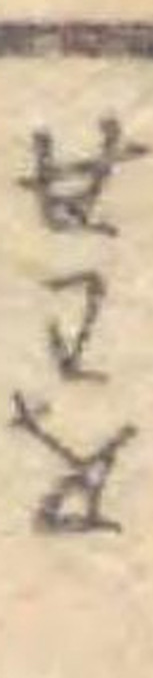せわを
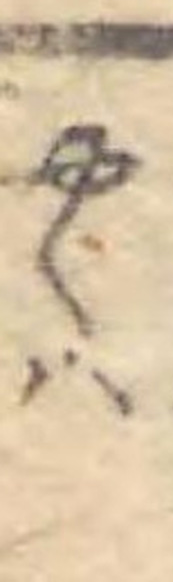やくは
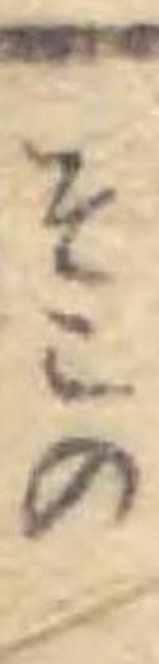そこの
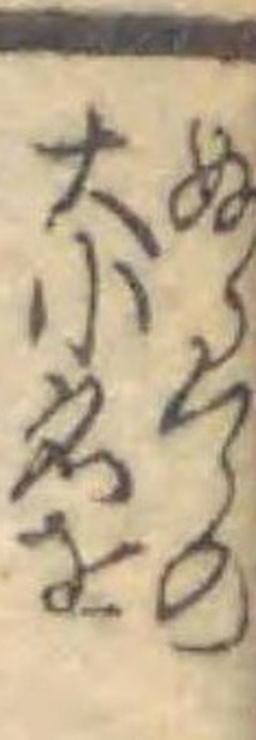大小名を
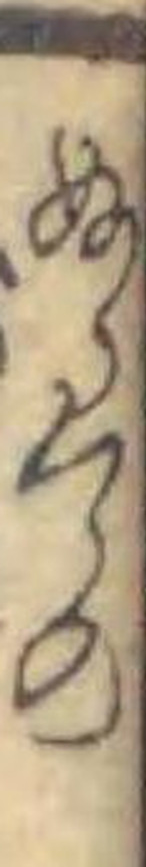ぬらくらの
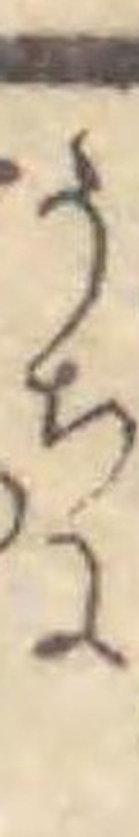うちに
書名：文武二道万石通 : 3巻
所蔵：国立国会図書館 National Diet Library, JAPAN
